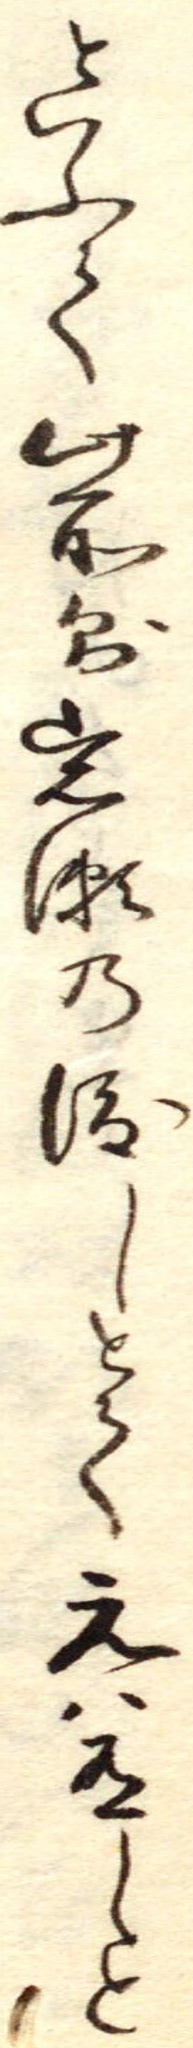といふて此所則岩瀬の渡しとて元は有しと
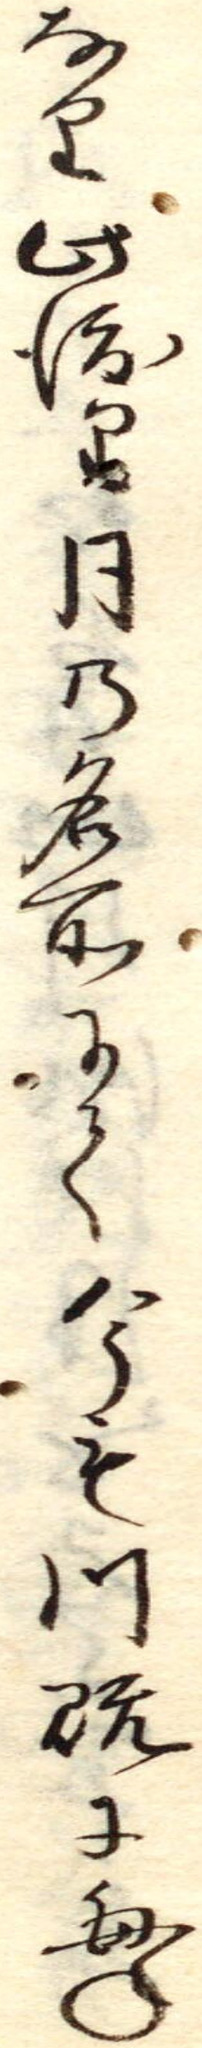なり此渡則月の名所にて今も川既に毎年
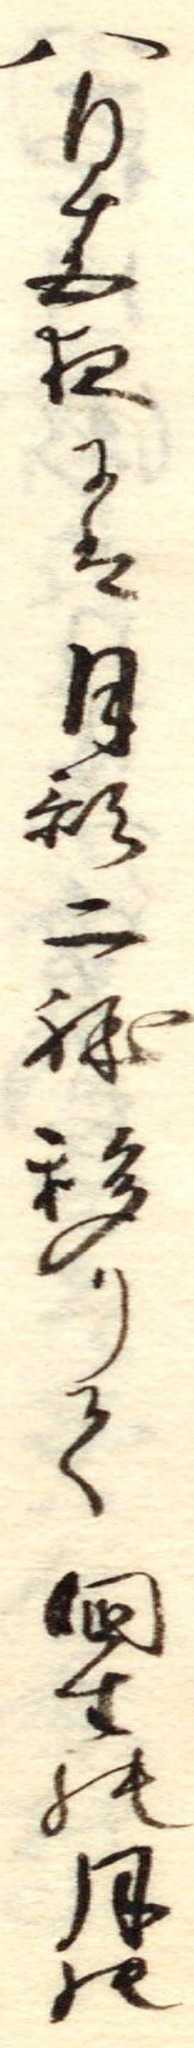八月十五夜には月影二躰移りて国生の月の
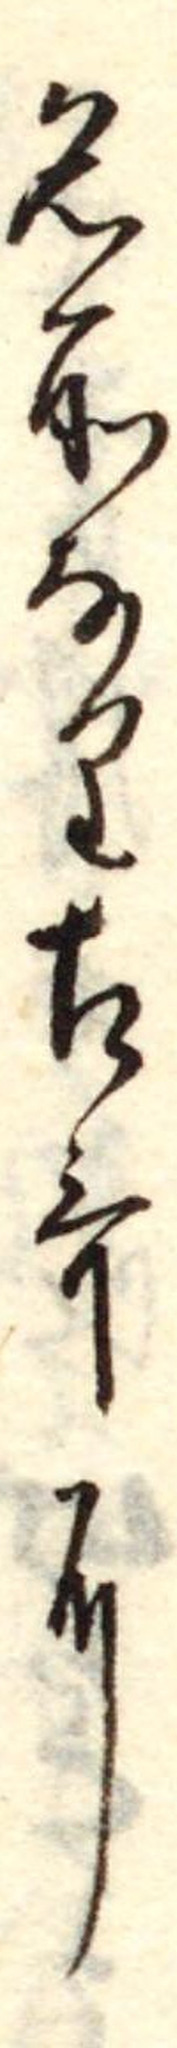名所なり古哥に
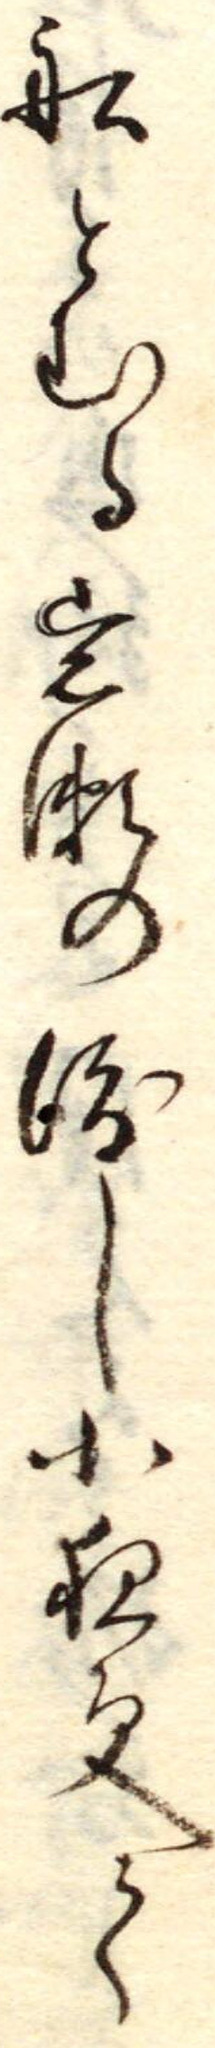船とむる岩瀬の渡し小夜更けて
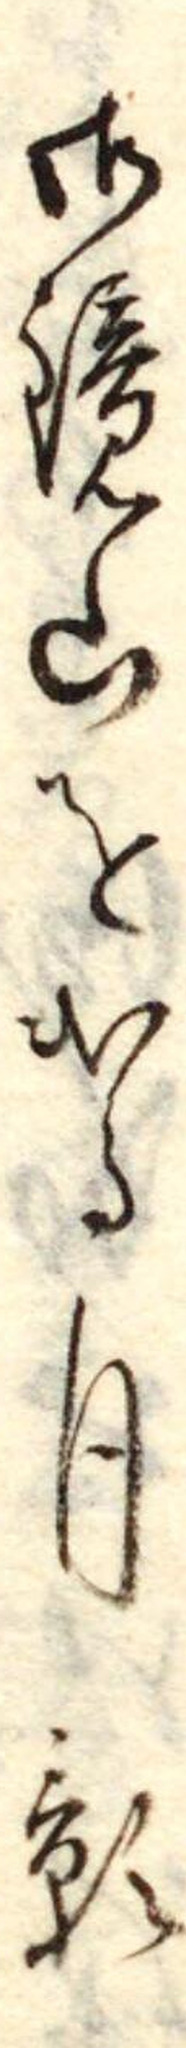御鏡山を出る月影
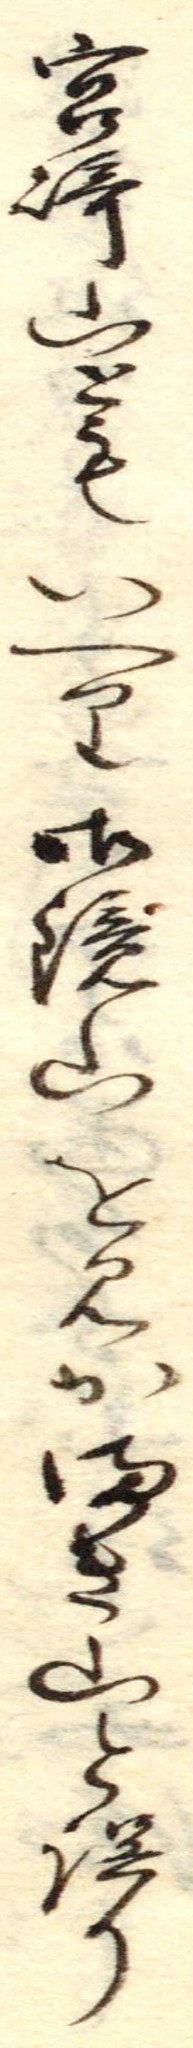宮崎山ともいへり御鏡山を見かまき山と誤り
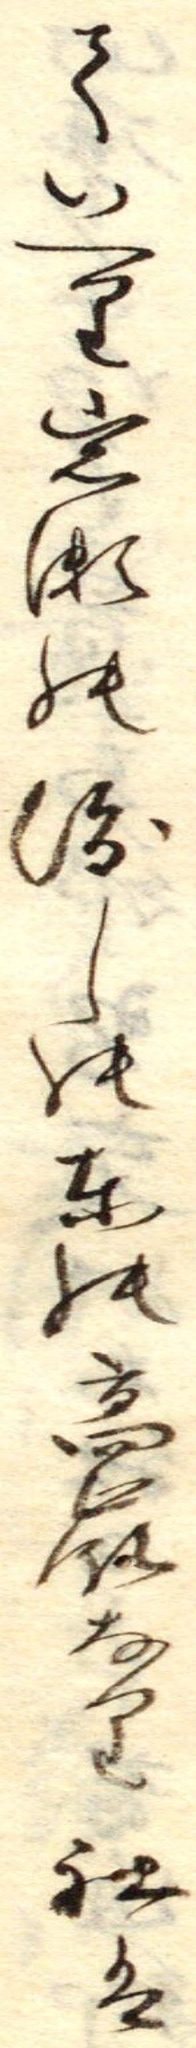ていへり岩瀬の渡しの東の高嶺なり社は

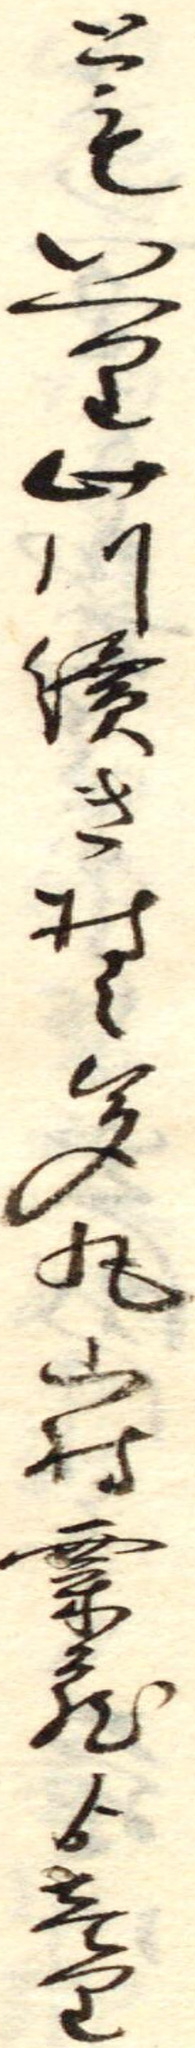ともいへり此川続き村々多丸山村粟蔵ゟ壱里
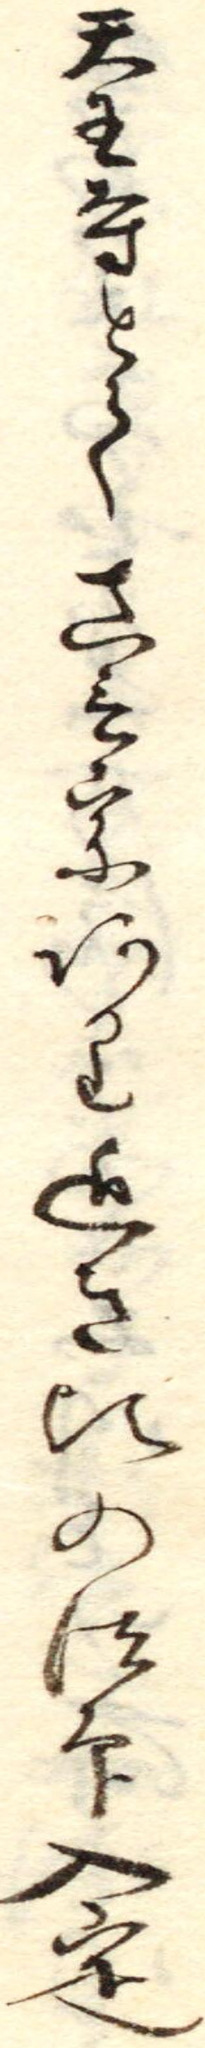天王寺とて真言宗あり近き頃の法印入定
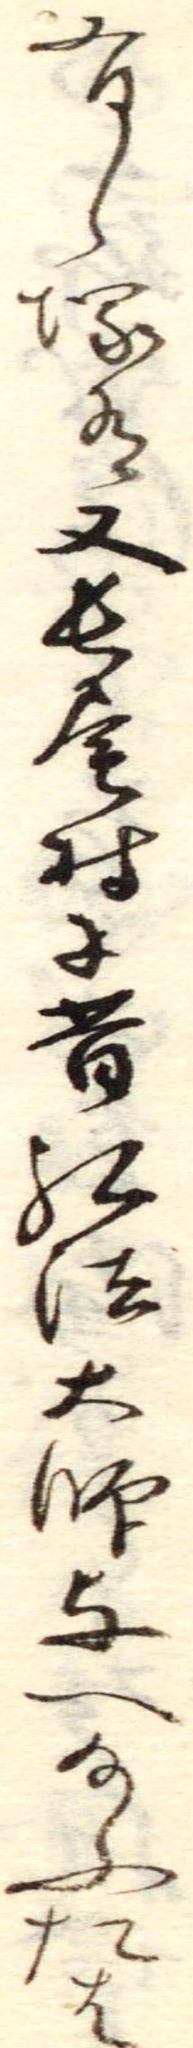有し塚有又長尾村に昔弘法大師与へ給ふたは
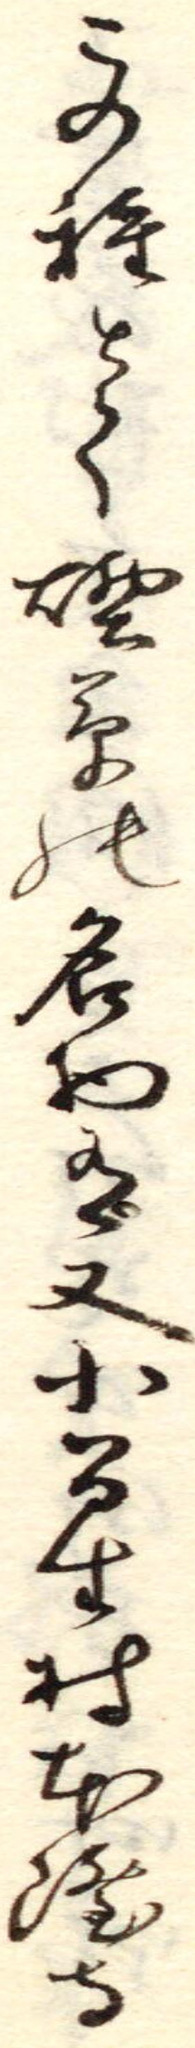この種とて煙草の名物有又小間生村本隆寺
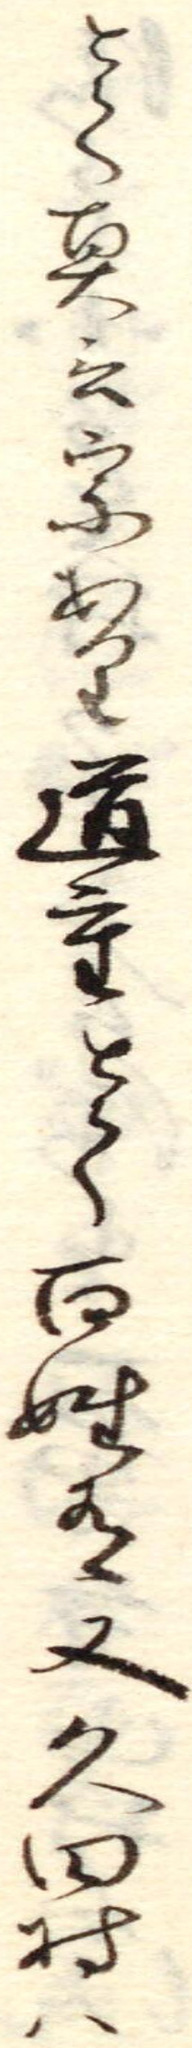とて真言宗あり道重とて百姓有又久田村は
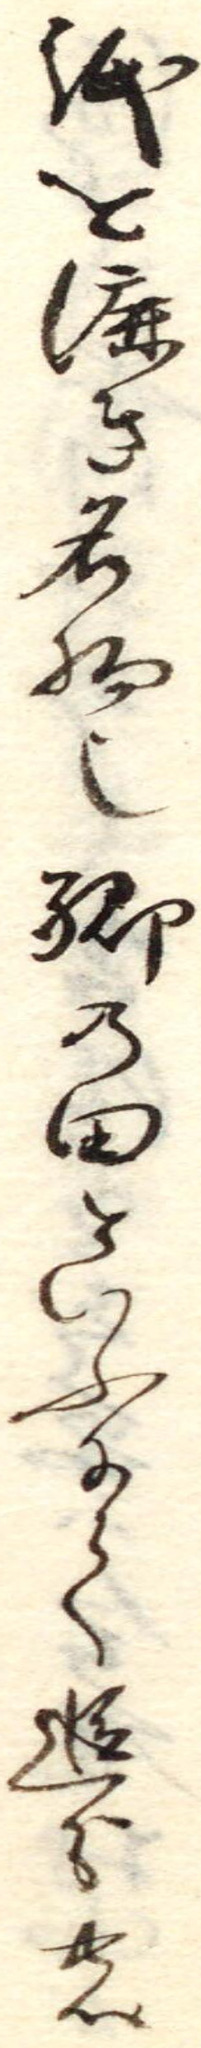紙を漉き名物也郷の田といふにて追分の
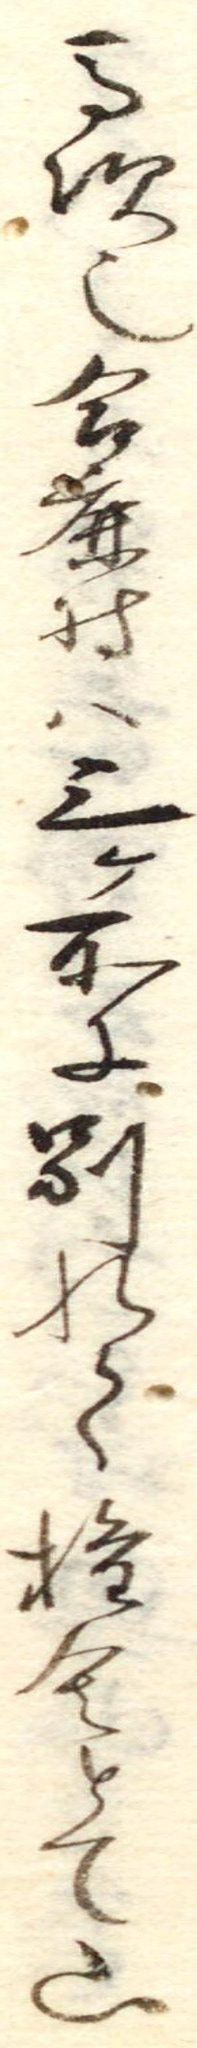馬次也合鹿村は三ヶ所に別れて権舎とて山
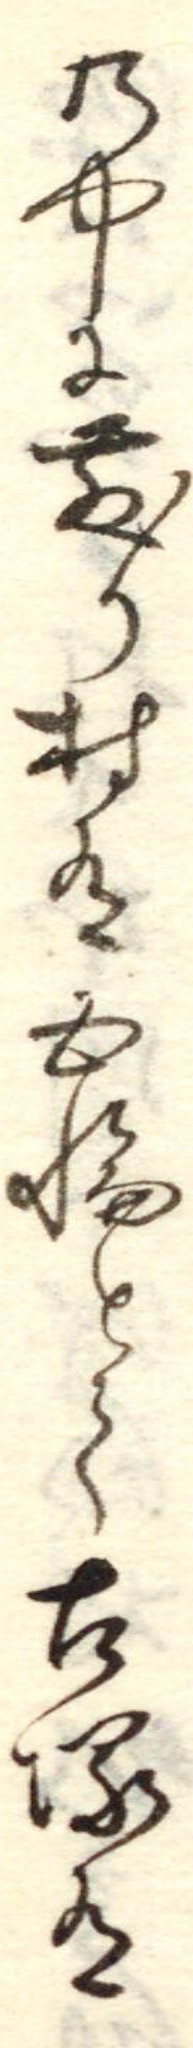の中に散り村有五輪とて古塚有
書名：能登名跡誌
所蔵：Ishikawa Prefectural Library
